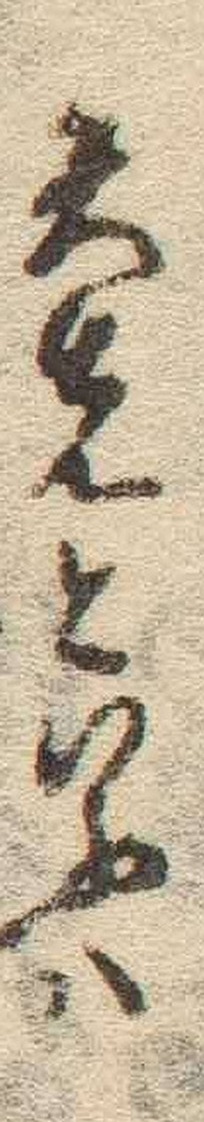矢先といふは
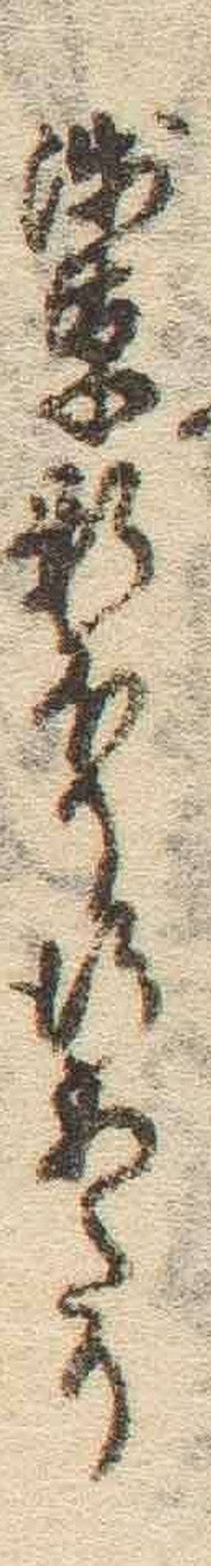浅草新ほり行あたり
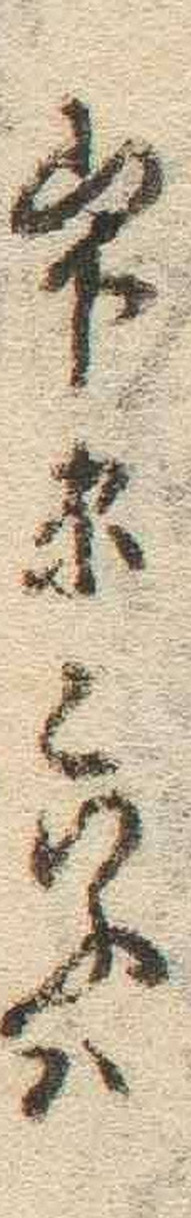山下原といふは
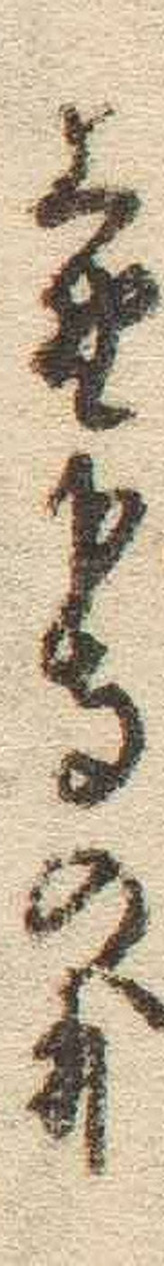上野下寺の外
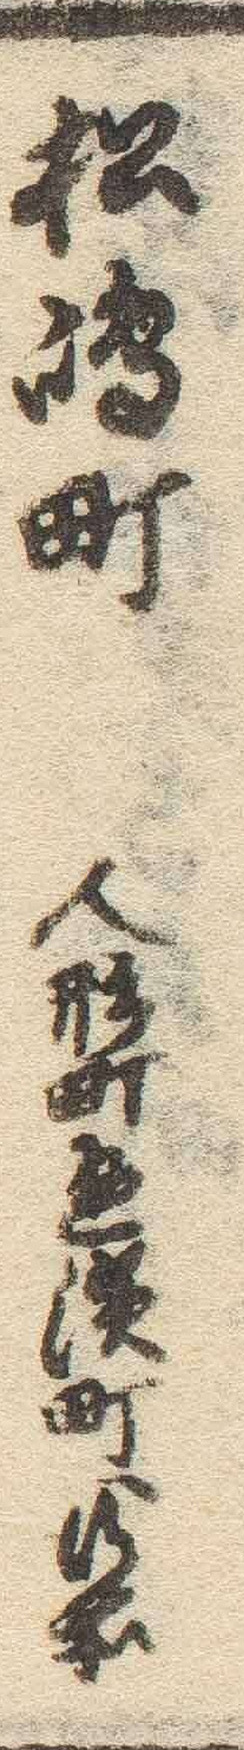松島町人形町通浜町へ行所
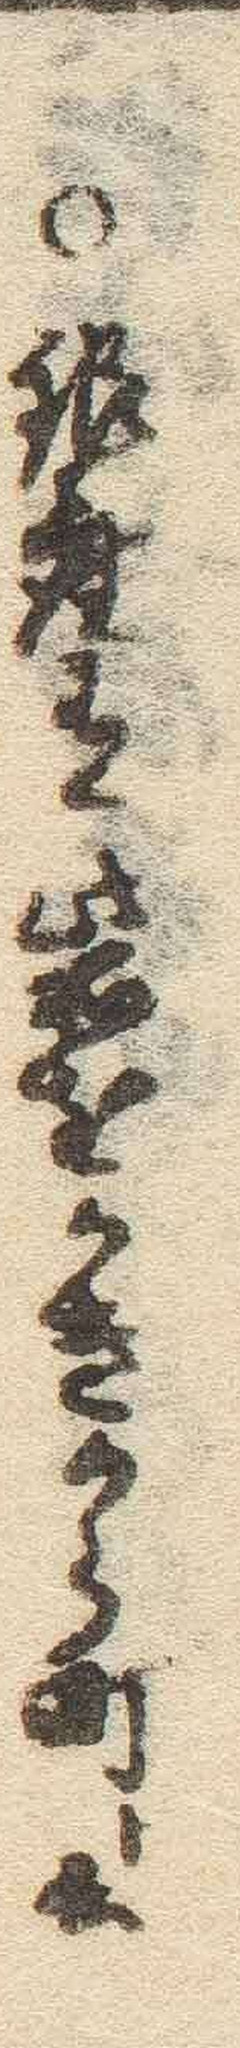◦銀座有此所をかきから町ト云
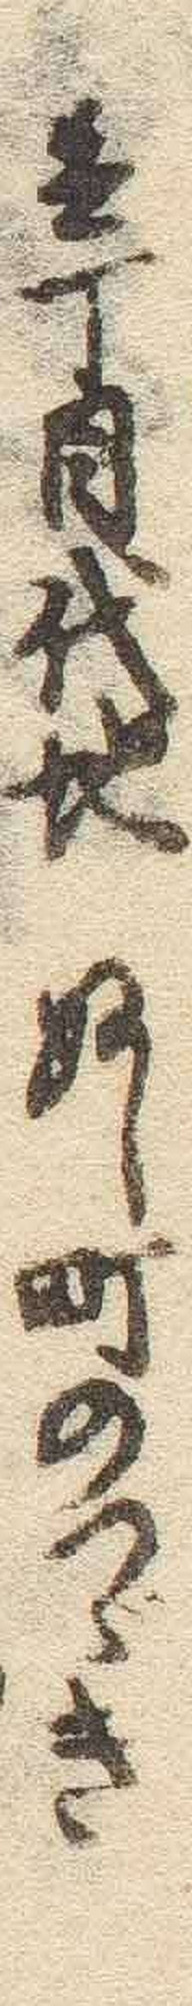壱丁目代地ぬし町のつゞき
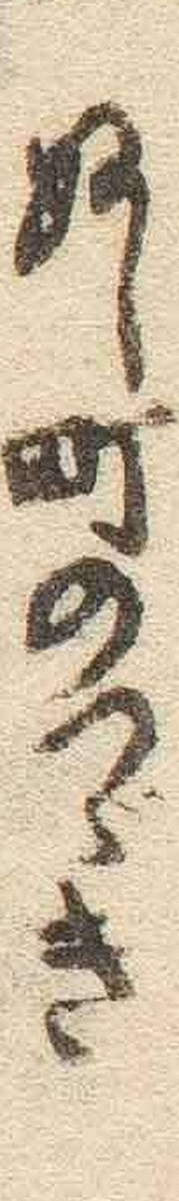米沢町のつゞき
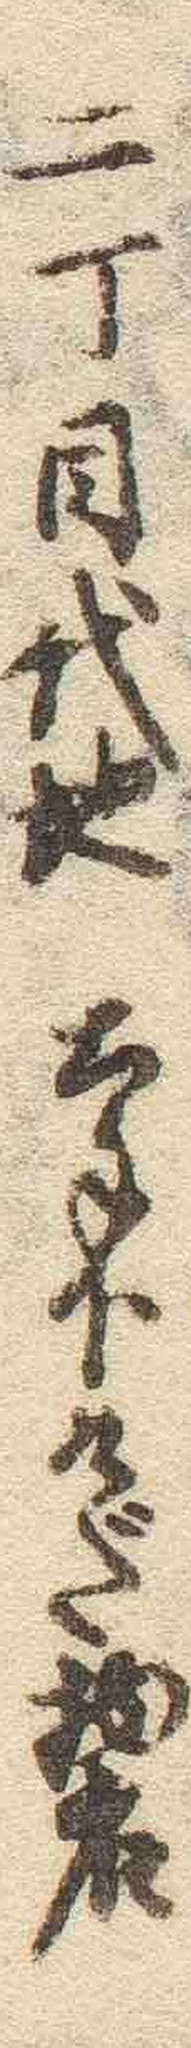二丁目代地土手下けだ物店
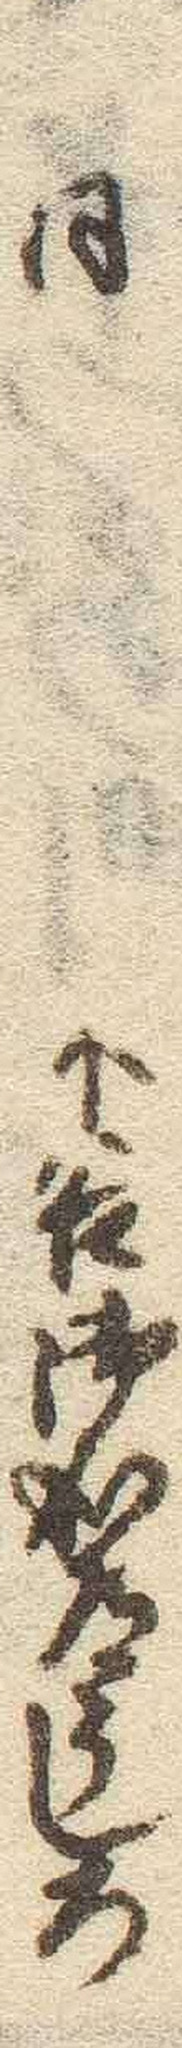同下谷御成道うしろ
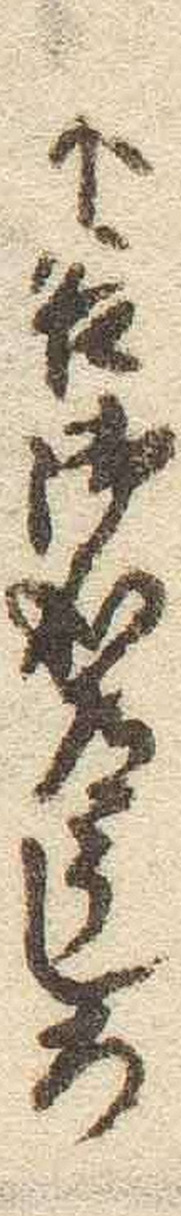同下谷御成道うしろ
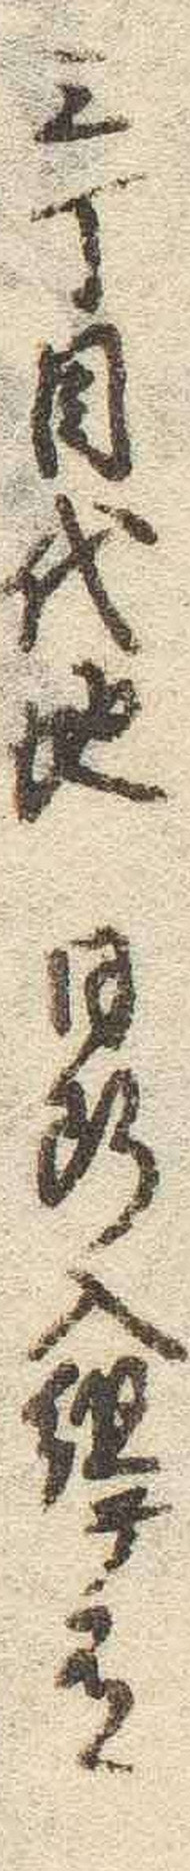三丁目代地同断入組テ有
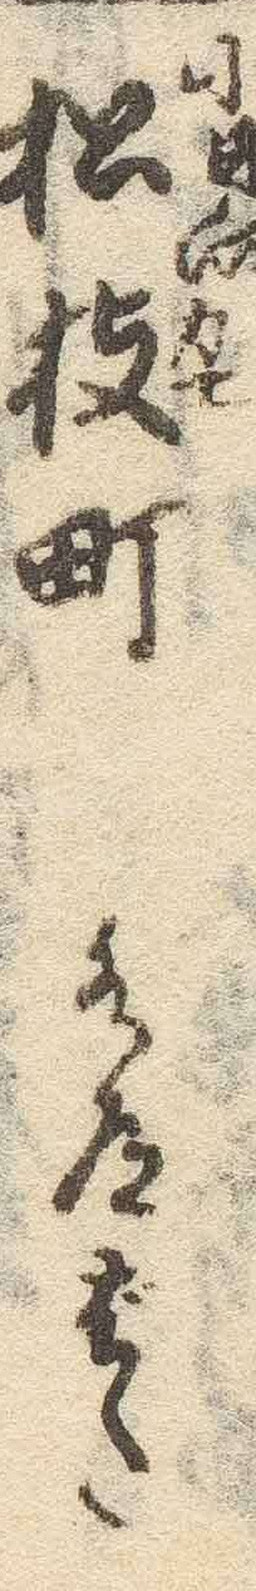松枝町水道ばた
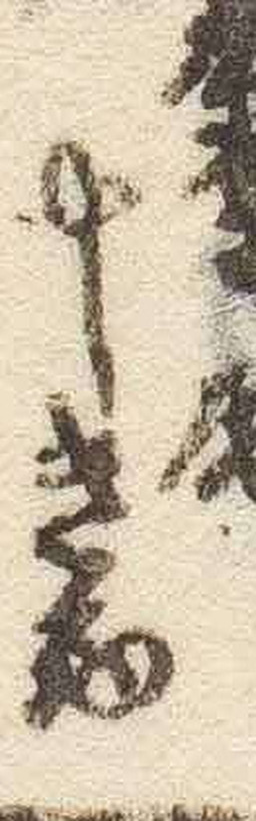やしき西
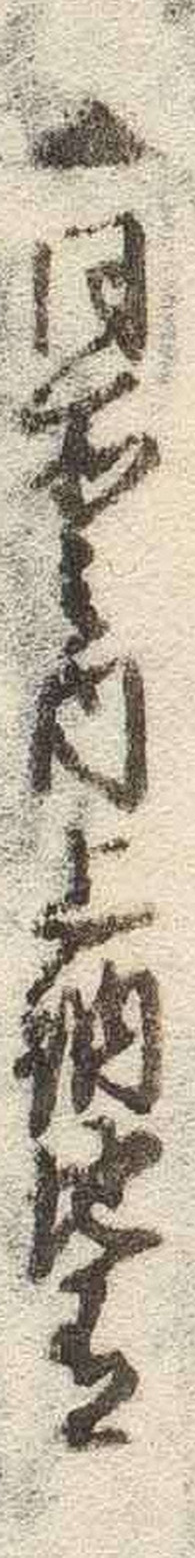▲同所之内上納地有
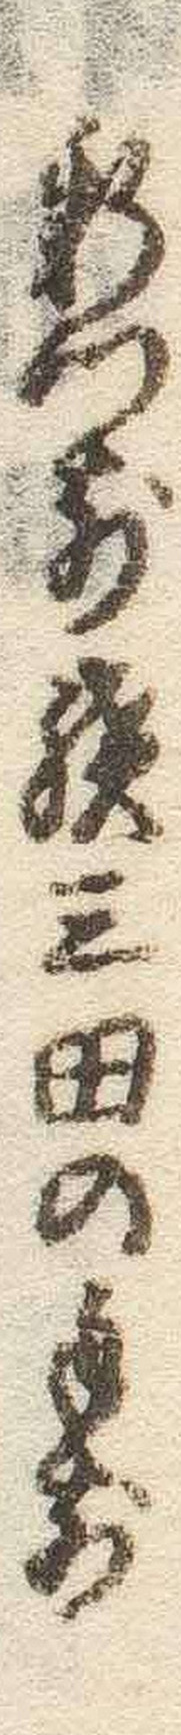新門前続三田の手前
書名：江戸町独案内
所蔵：東京学芸大学附属図書館 国文学研究資料館
